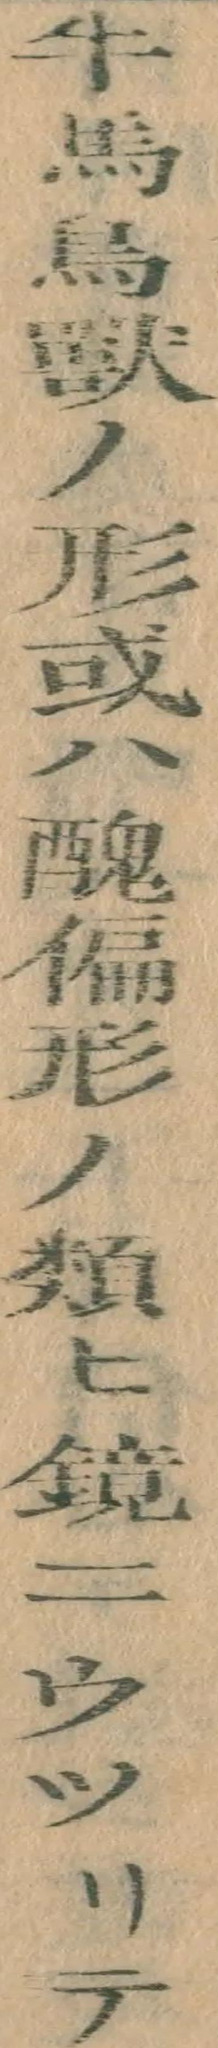牛馬鳥獣ノ形或ハ醜偏形ノ類ヒ鏡ニウツリテ
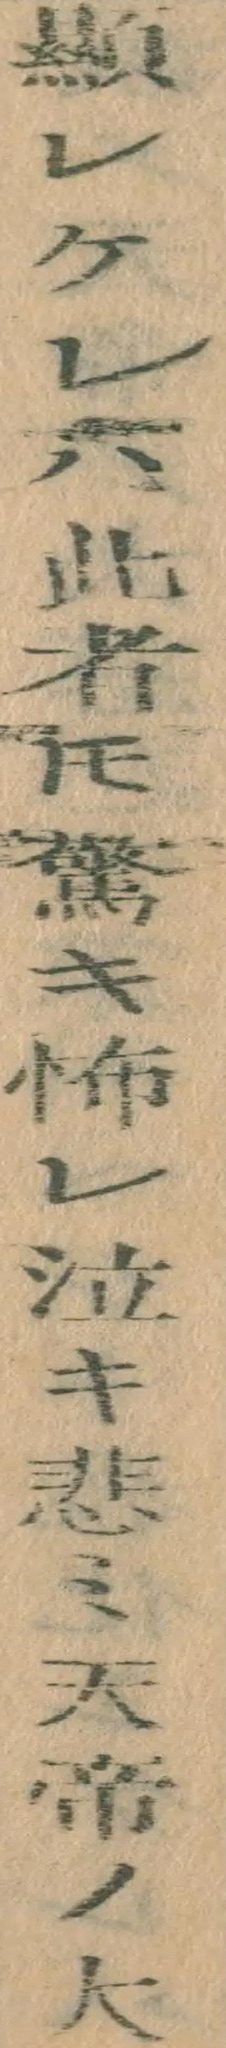顕レケレハ此者トモ驚キ怖レ泣キ悲ミ天帝ノ大
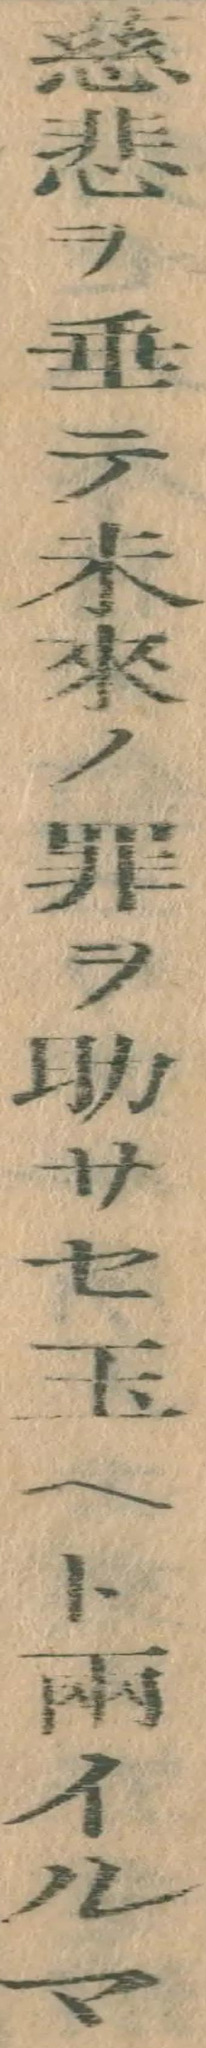慈悲ヲ垂テ未来ノ罪ヲ助サセ玉ヘト両イルマ
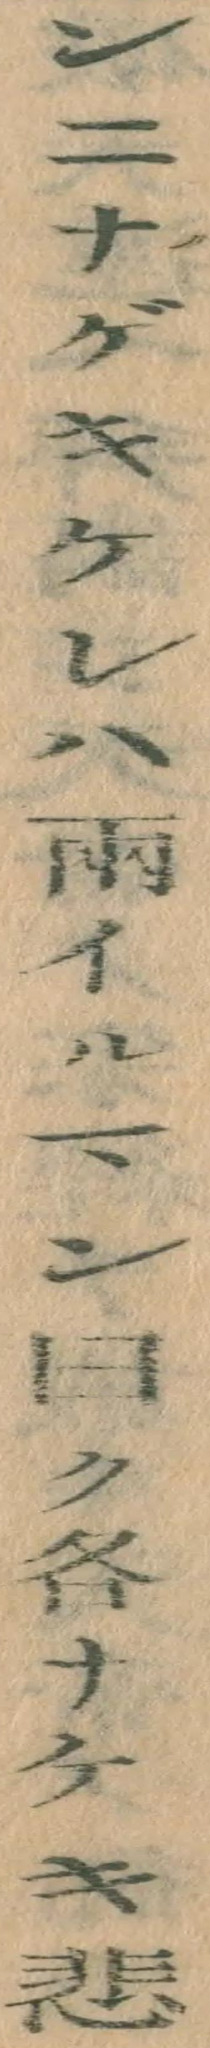ンニナゲキケレハ両イルマン曰ク各ナケキ悲
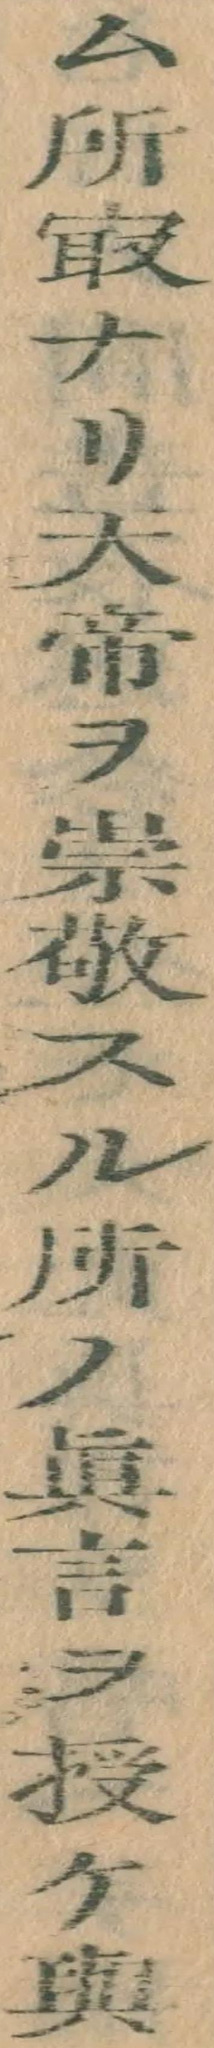ム所最ナリ天帝ヲ崇敬スル所ノ真言ヲ授ケ与
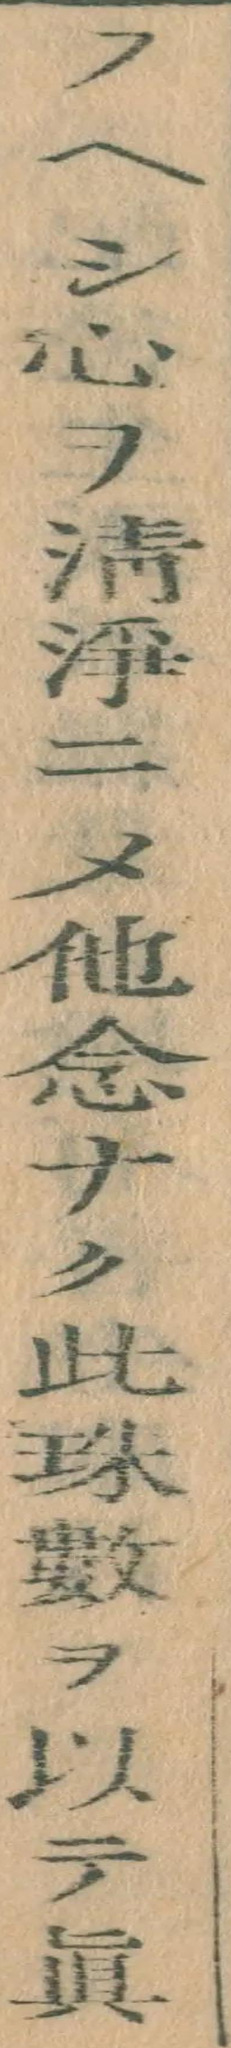フヘシ心ヲ清浄ニシテ他念ナク此珠数ヲ以テ真
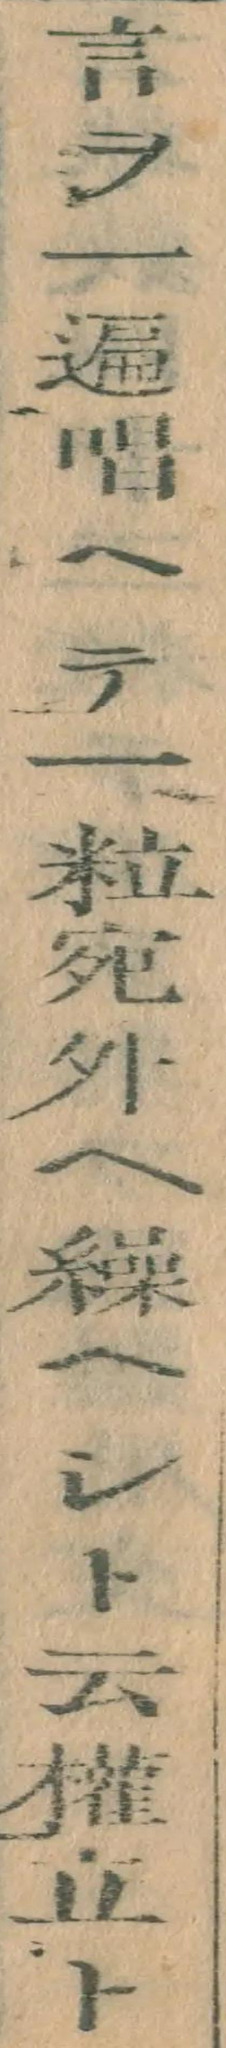言ヲ一遍唱ヘテ一粒宛外ヘ繰ヘシト云権立ト

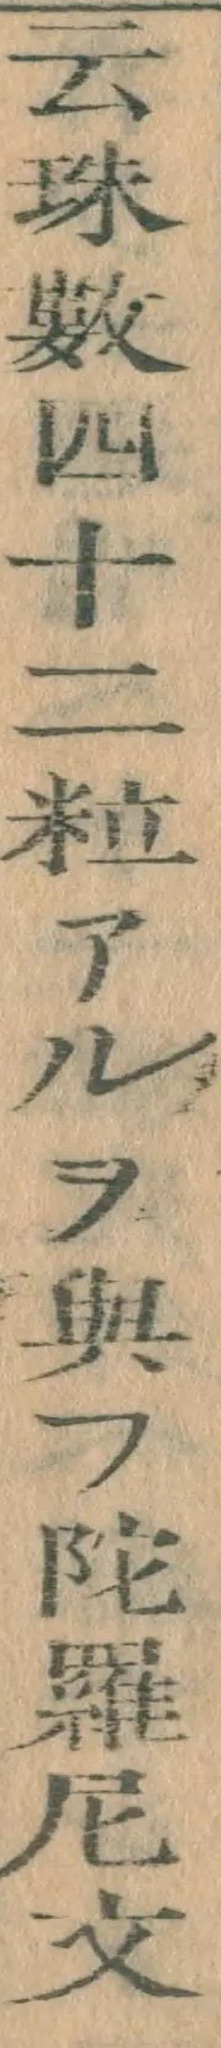云珠数四十二粒アルヲ与フ陀羅尼文
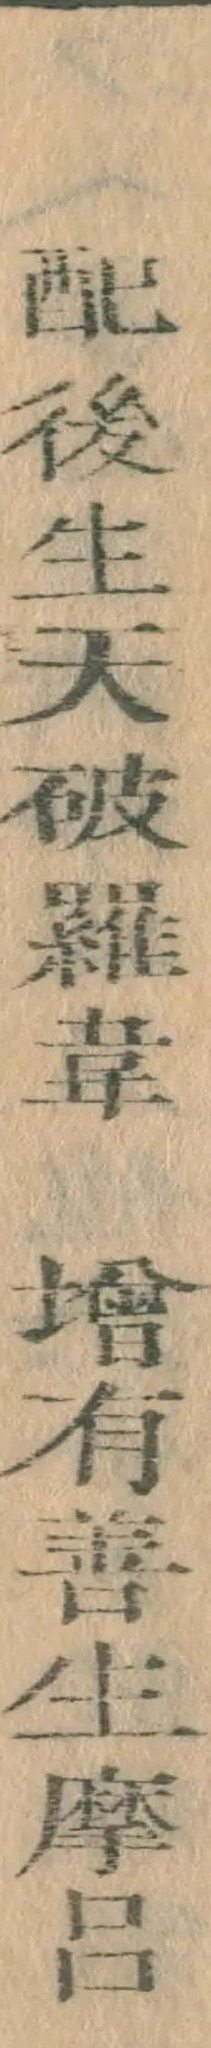配後生天破羅韋増有善生摩呂
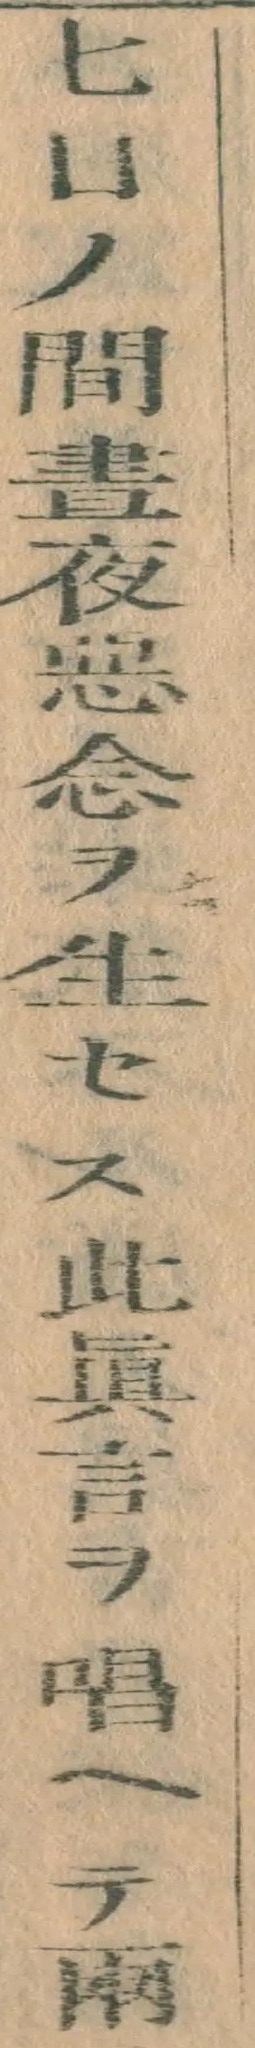七日ノ間昼夜悪念ヲ生セス此真言ヲ唱ヘテ両
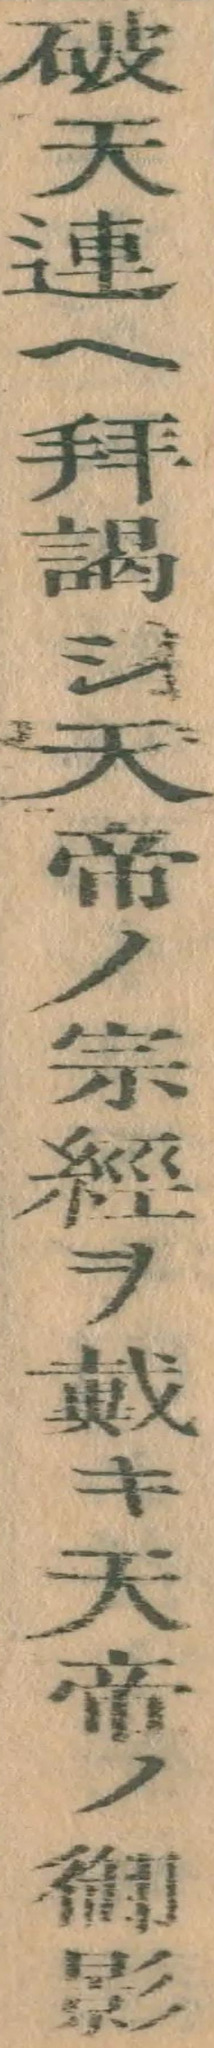破天連ヘ拝謁シ天帝ノ宗経ヲ戴キ天帝ノ御影
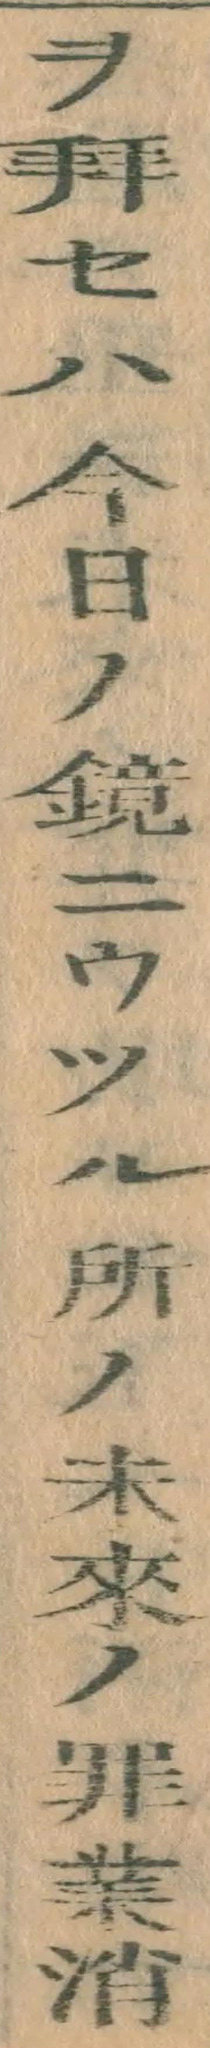ヲ拝セハ今日ノ鏡ニウツル所ノ未来ノ罪業消
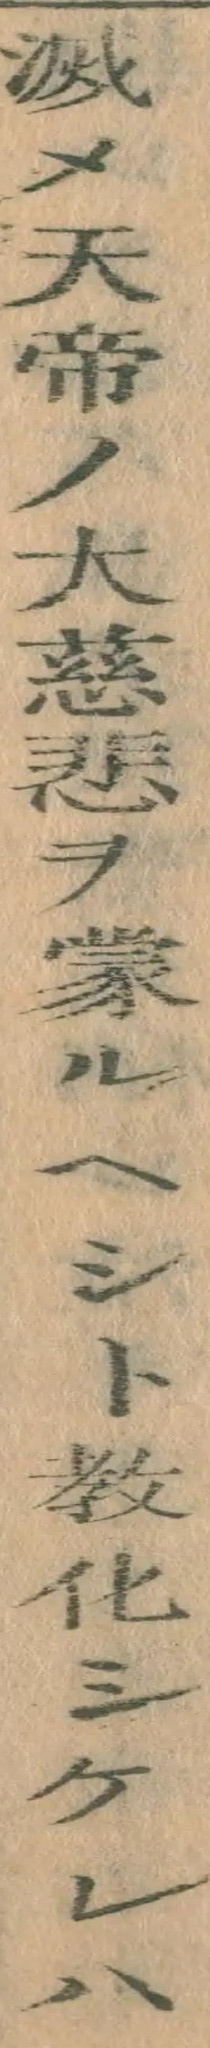滅シテ天帝ノ大慈悲ヲ蒙ルヘシト教化シケレハ
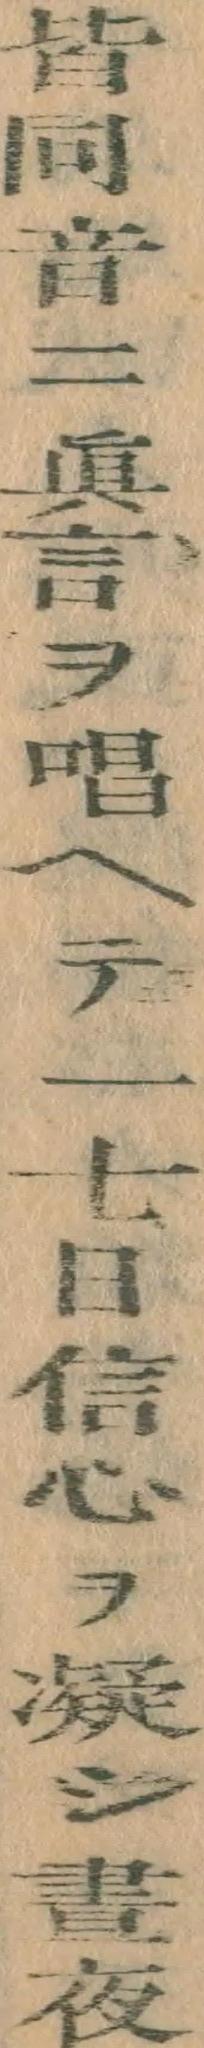皆同音ニ真言ヲ唱ヘテ一七日信心ヲ凝シ昼夜
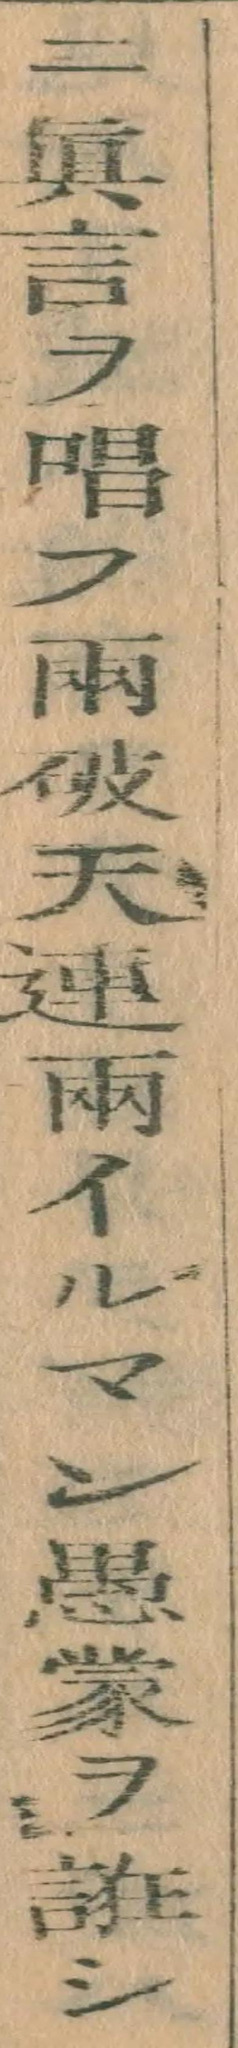ニ真言ヲ唱フ両破天連両イルマン愚蒙ヲ誑シ
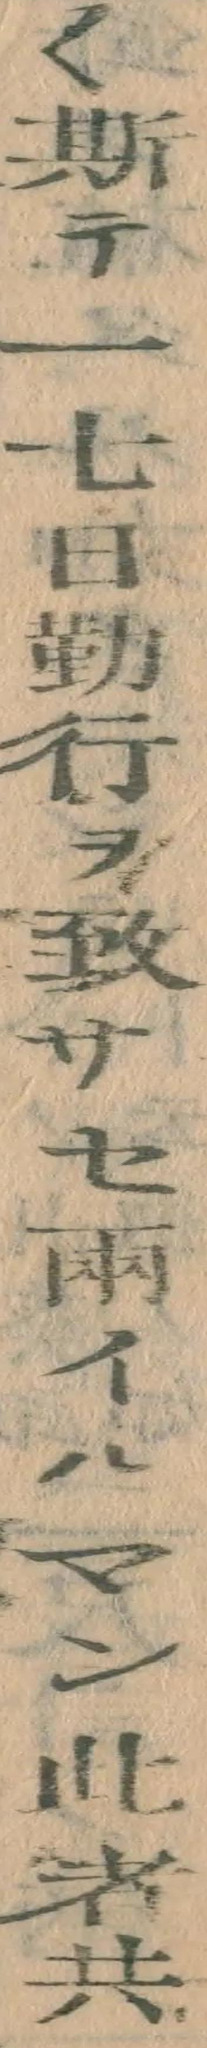〱斯テ一七日勤行ヲ致サセ両イルマン此者共
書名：南蛮寺興廃記
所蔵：国立国会図書館 National Diet Library, JAPAN
